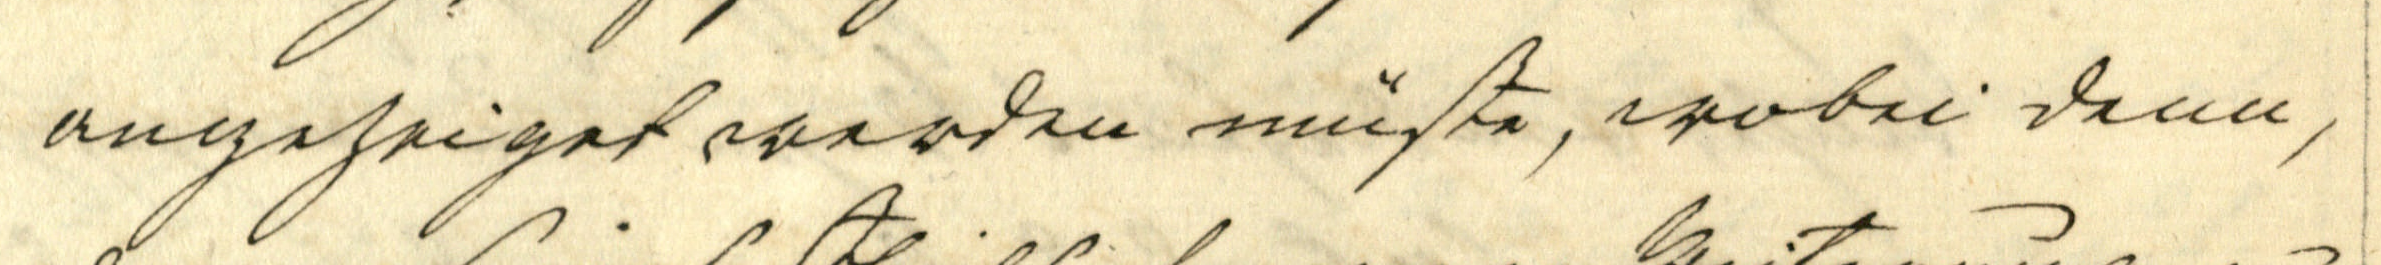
angezeiget werden müßte, wobei denn,
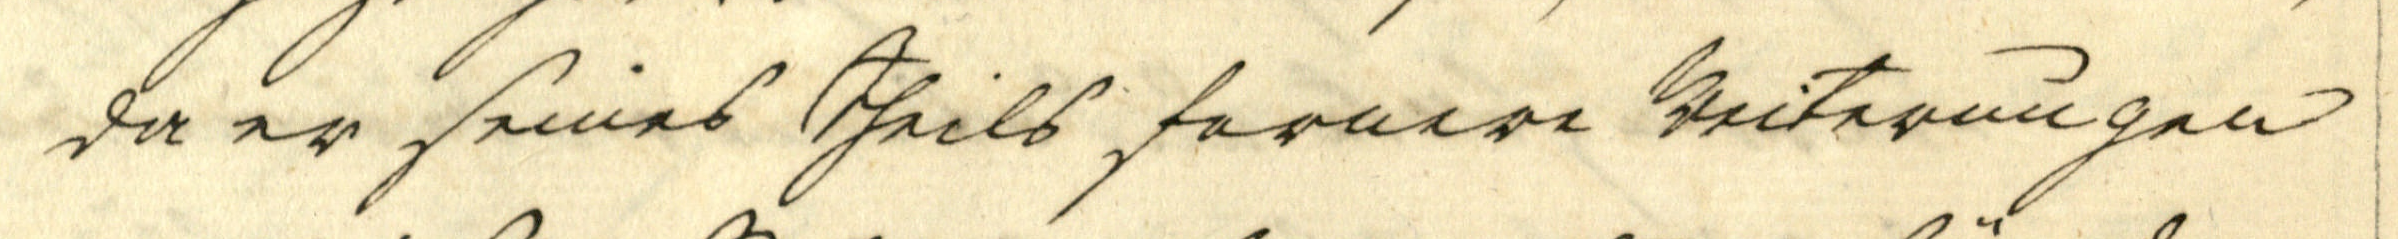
da er seines Theils fernere Weiterungen
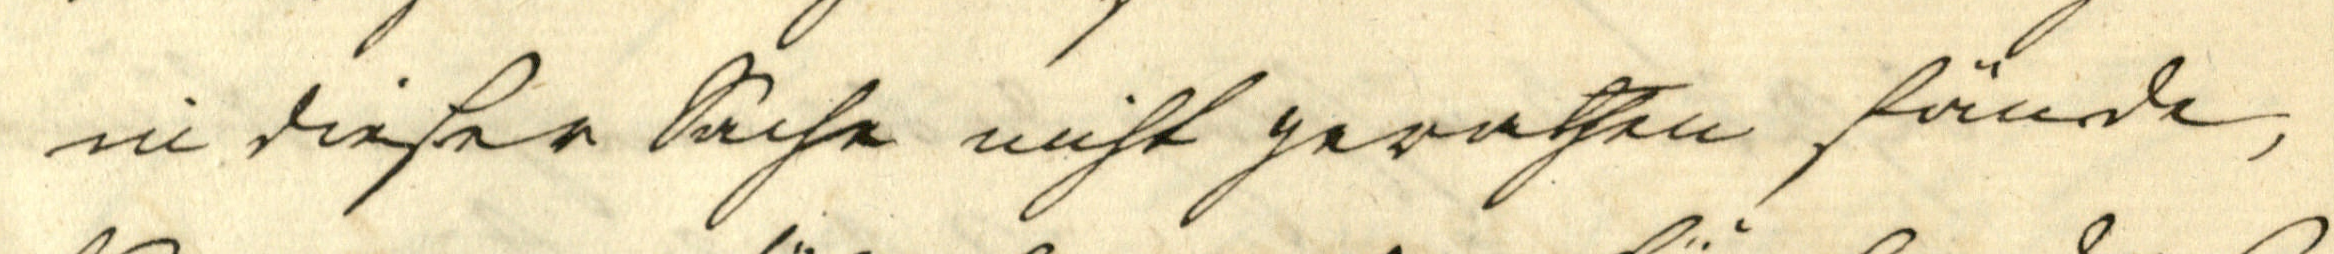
in dieser Sache nicht gerathen fände,
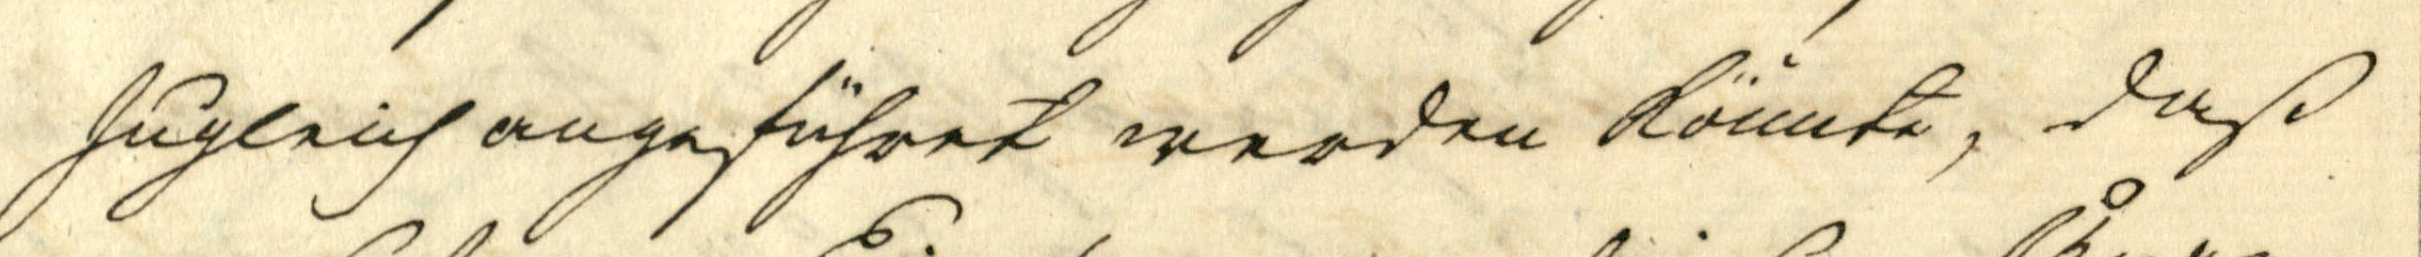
zugleich angeführet werden könnte, daß
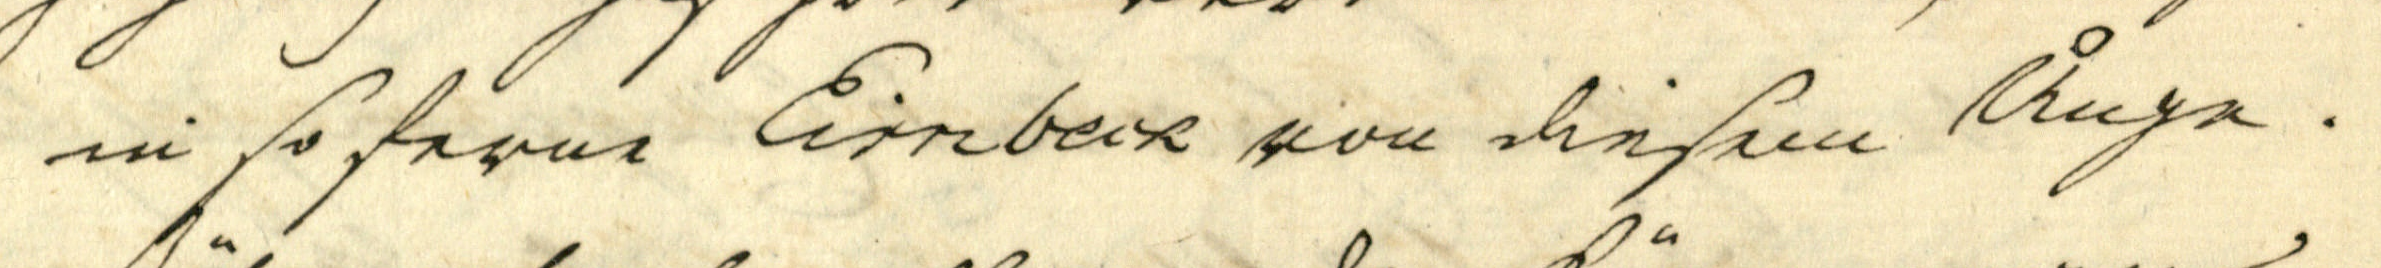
in so ferne Eimbeck von diesem Unge¬
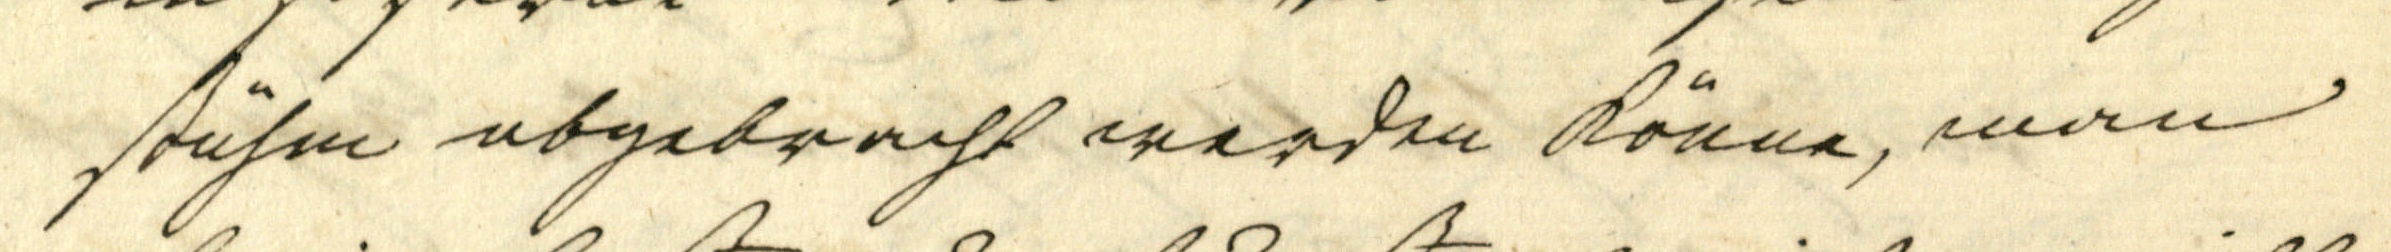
stühm abgebracht werden könne, man
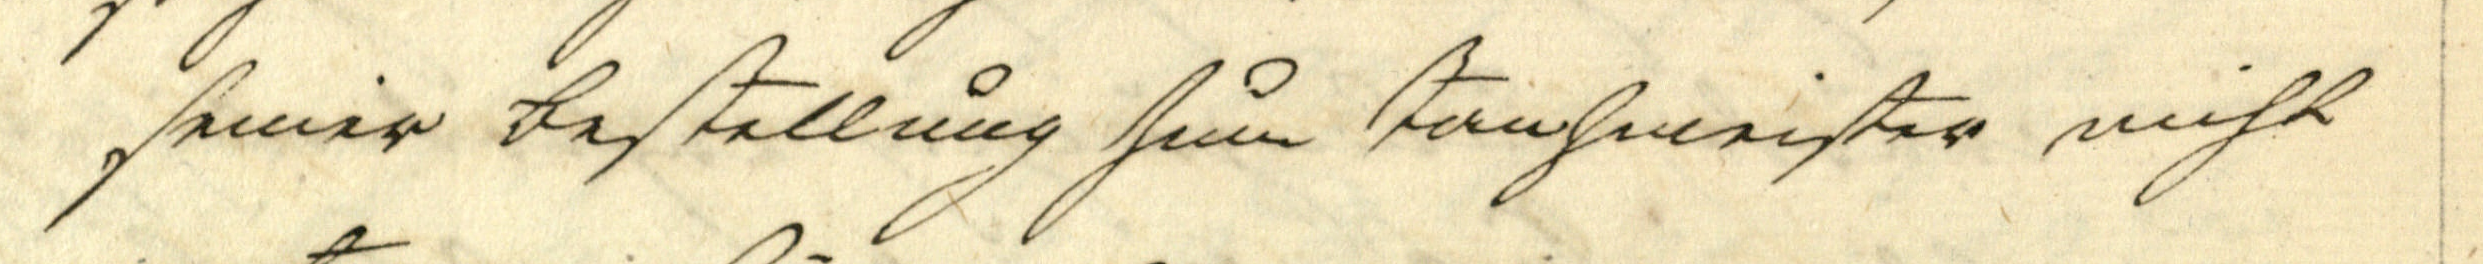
seiner Bestellung zum Tanzmeister nicht
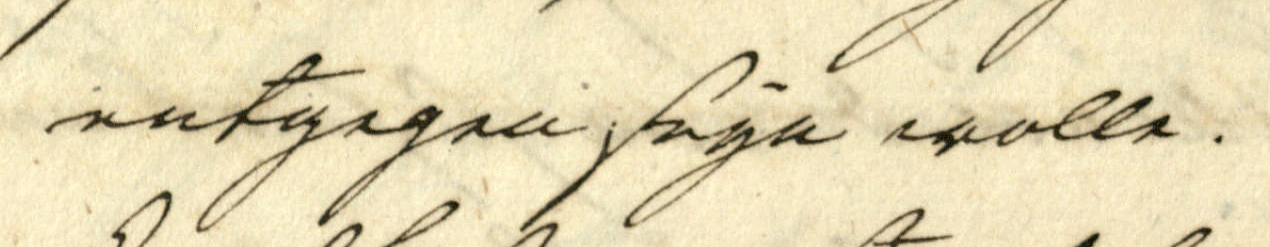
entgegen seÿn wolle.
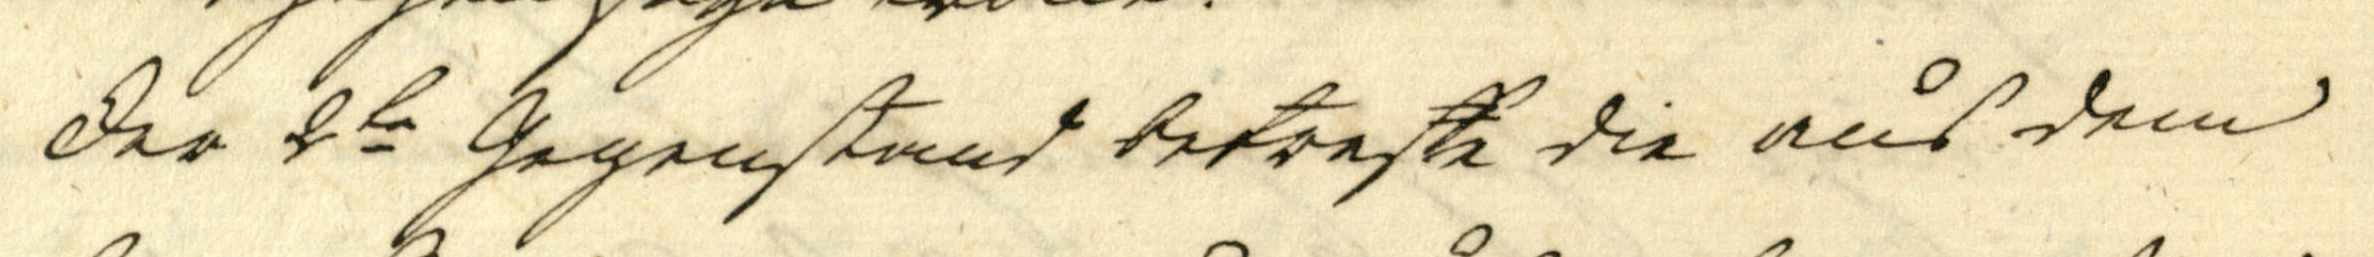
Der 2 te Gegenstand betreffe die aus dem
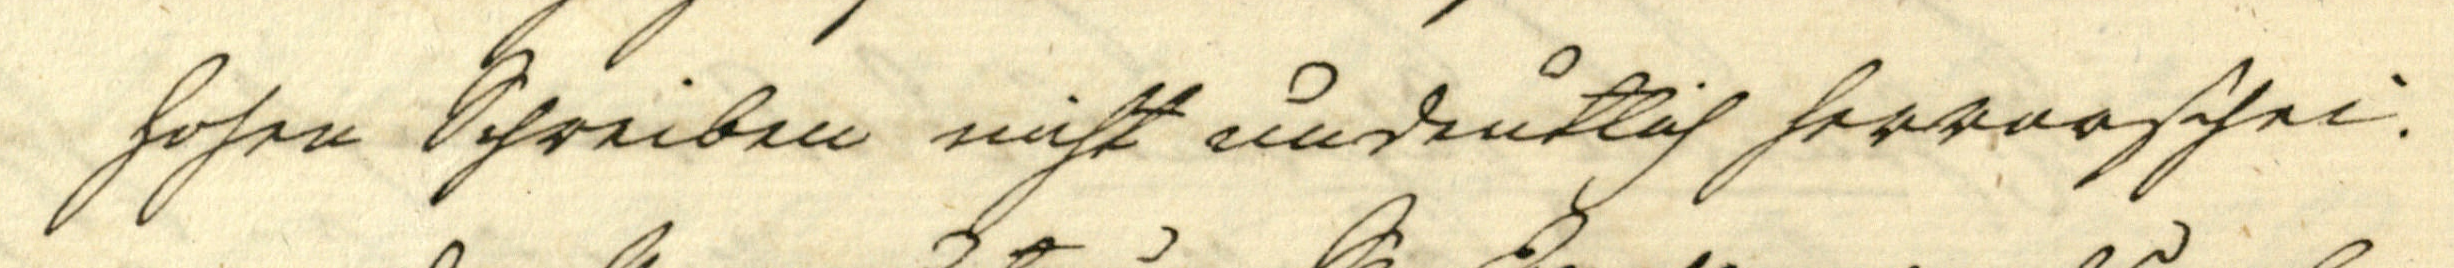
hohen Schreiben nicht undeutlich hervorschei¬
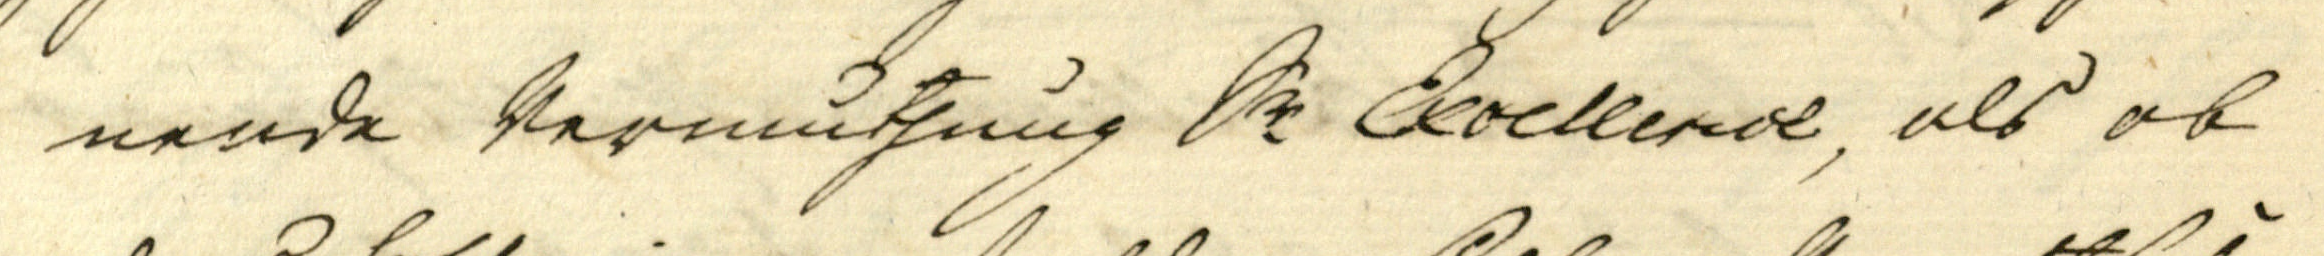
nende Vermuthung Sr. Excellence, als ob
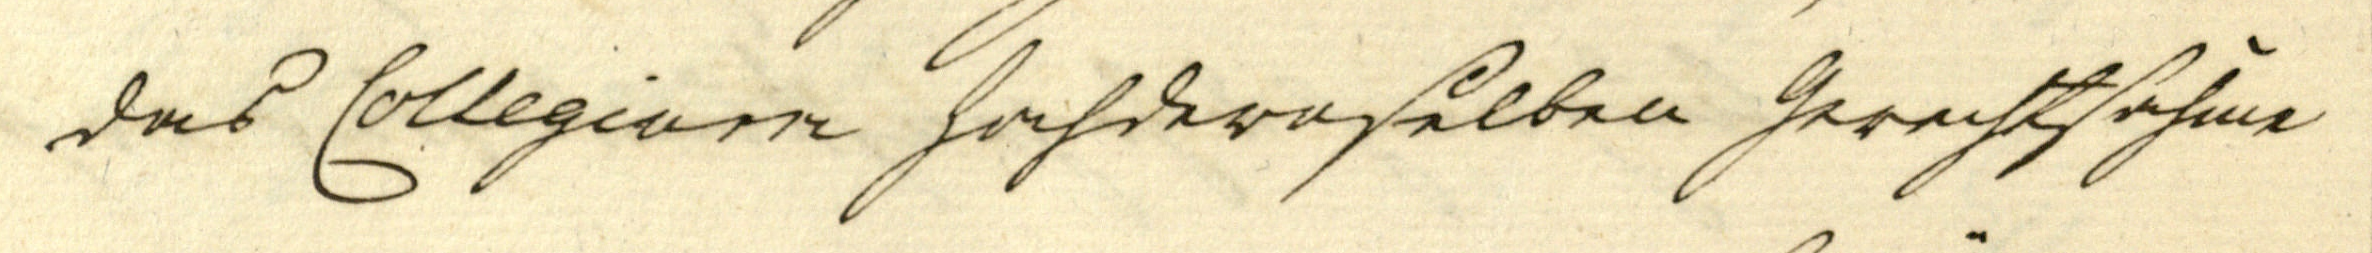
das Collegium Hochderoselben Gerechtsahme
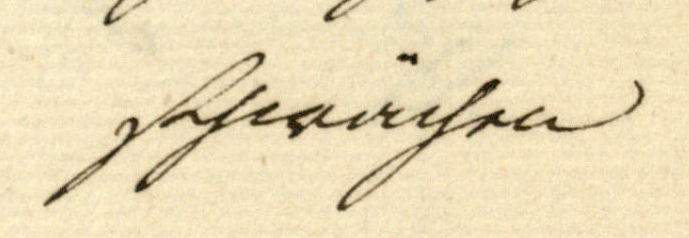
schwächen
